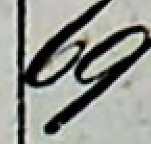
69
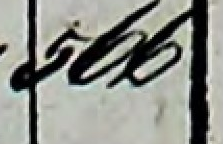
566
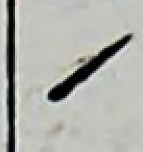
1
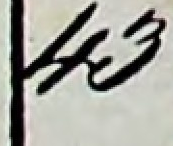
43
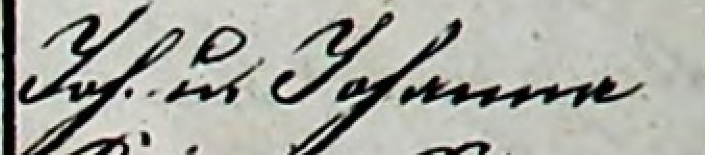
Joh. u. Johanna
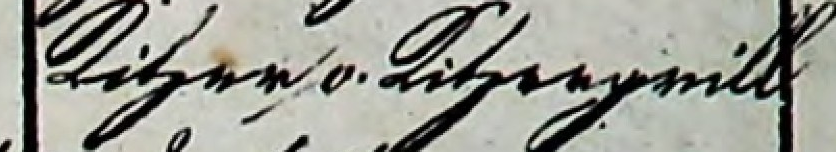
Kitzer v. Kitzergrill
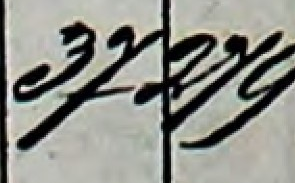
37 279
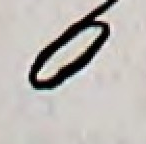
6
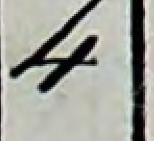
4
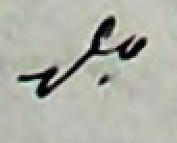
do
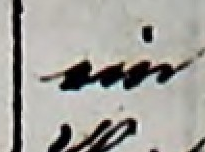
ein
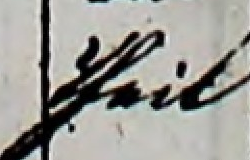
Theil
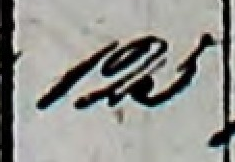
125
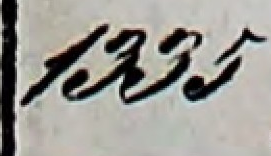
1335
